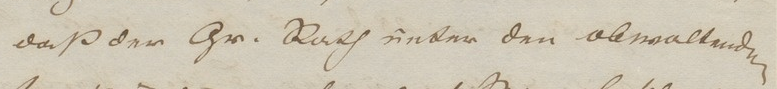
daß der Gr. Rath unter den obwaltenden
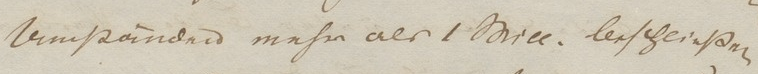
Umständen mehr als 1 Mill. beschließen
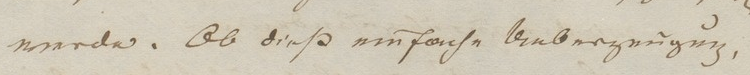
werde. Ob dieß einfache Ueberzeugung,
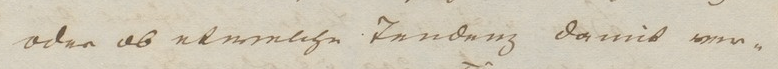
oder ob etwelche Tendenz damit ver-
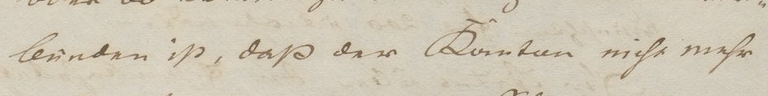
bunden ist, daß der Kanton nicht mehr
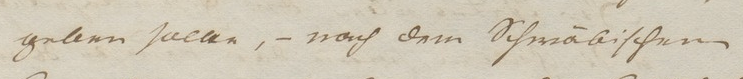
geben sollte, – nach dem Schwäbischen
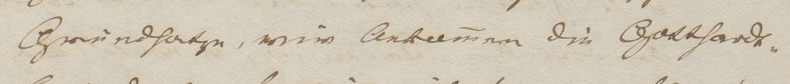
Grundsatze, wir bekommen die Gotthardt -
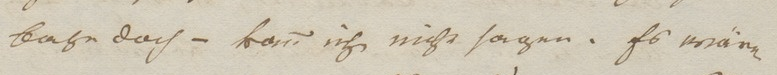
bahn doch – kann ich nicht sagen Es wäre
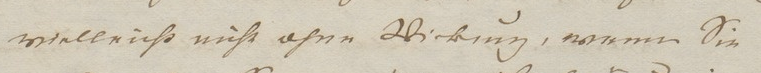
vielleicht nicht ohne Wirkung, wenn Sie
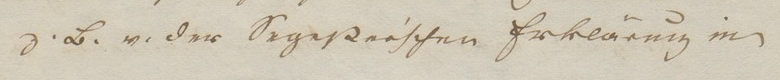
z. B. v. der Segeßer'schen Erklärung in
